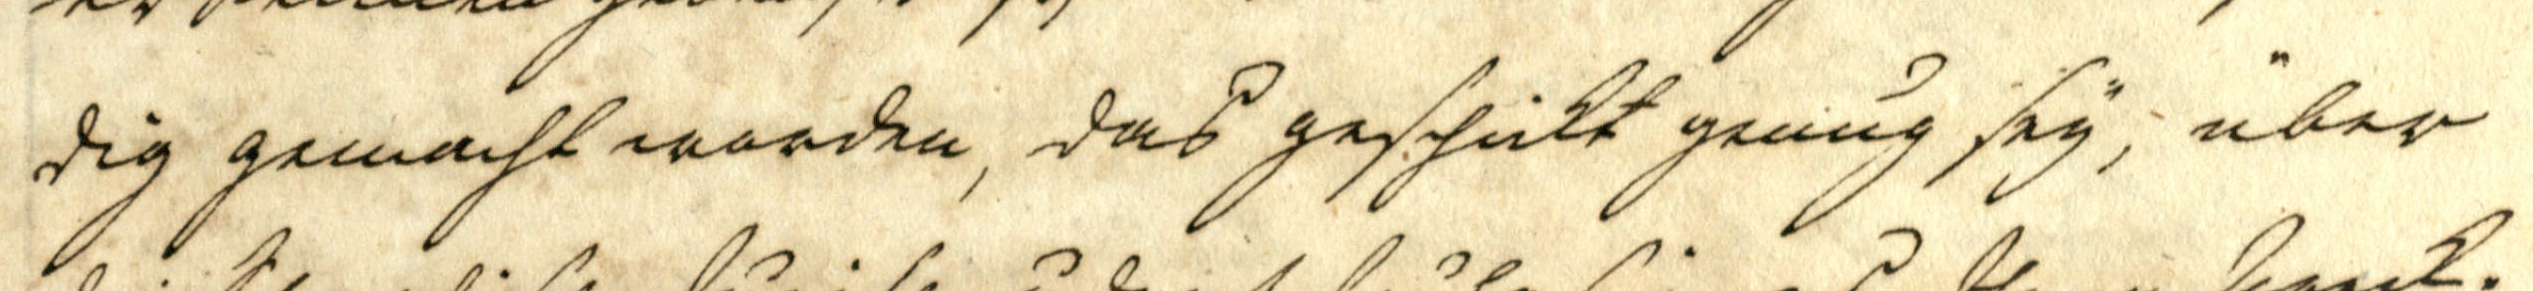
dig gemacht werden, das geschickt genug seÿ, über
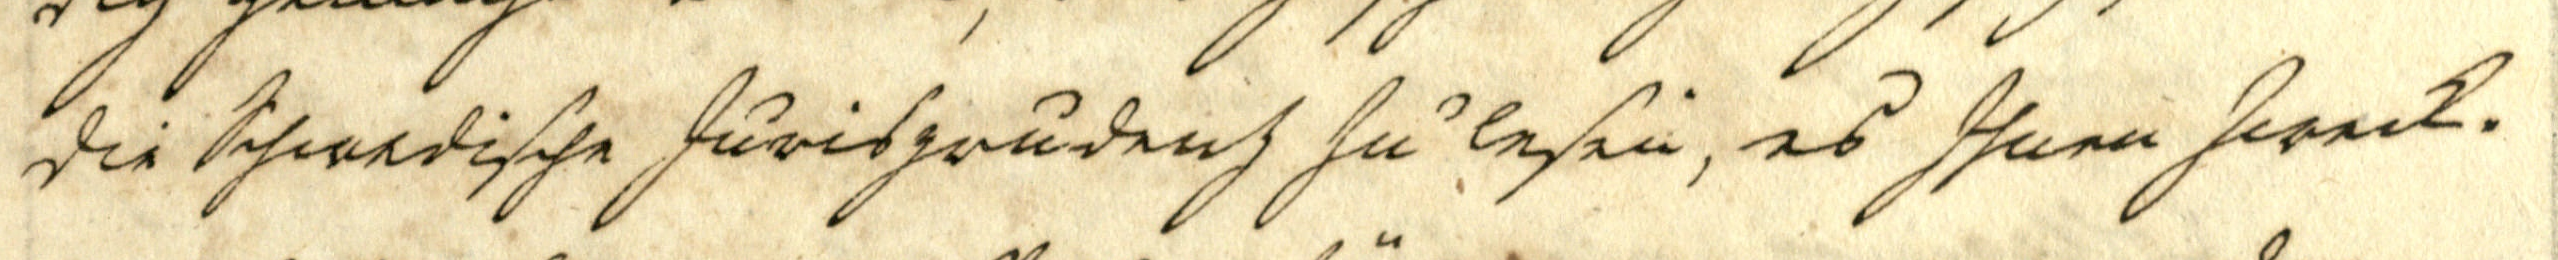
die Schwedische Jurisprudenz zu lesen, es Ihnen Zweck¬
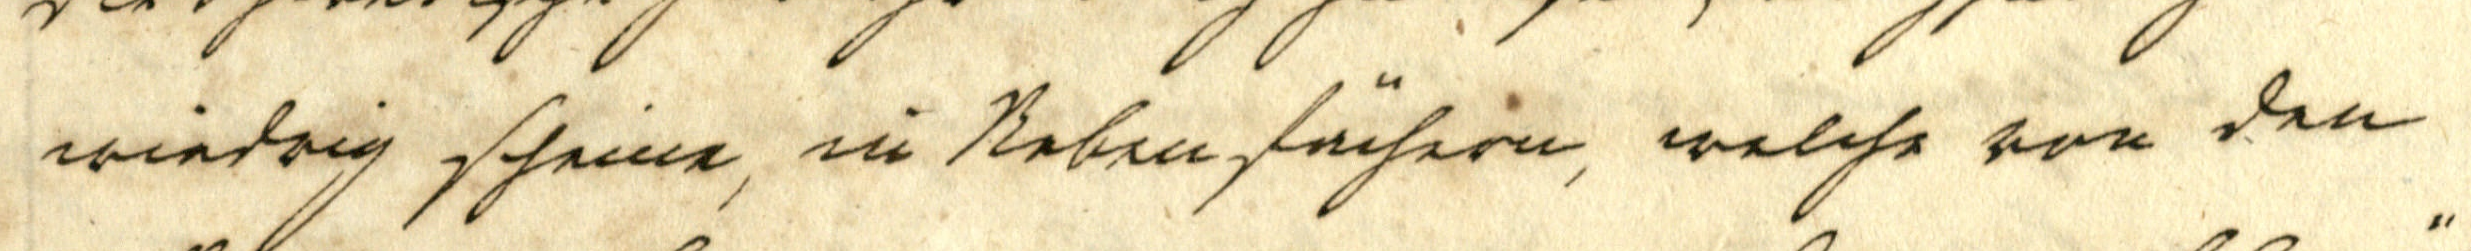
wiedrig scheine, in Nebenfächern, welche von den
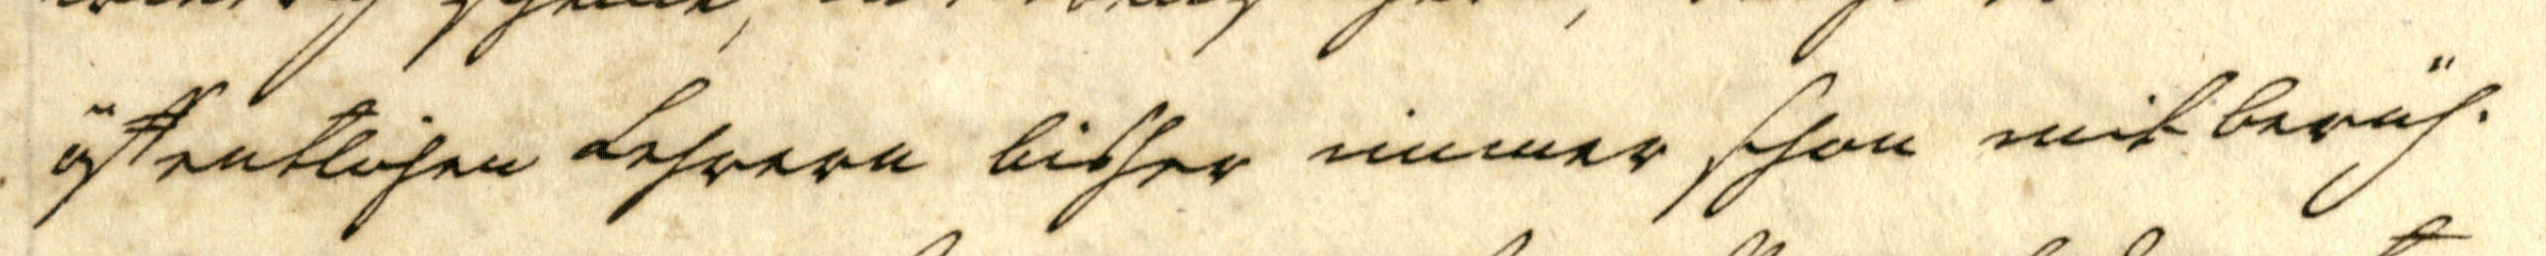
öffentlichen Lehrern bisher immer schon mit berüh¬
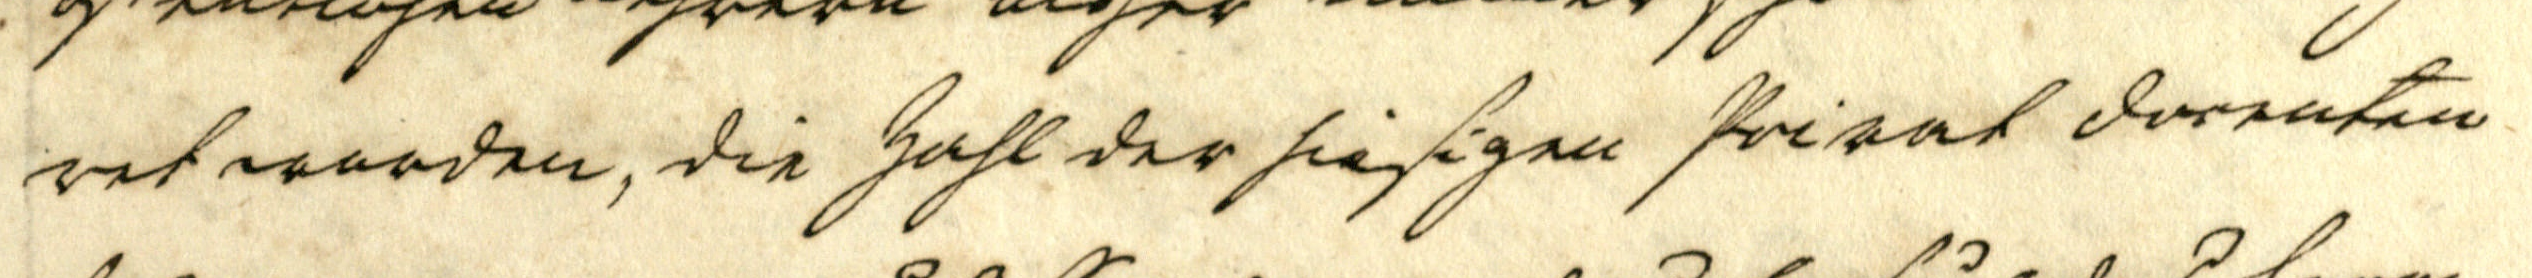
ret werden, die Zahl der hiesigen Privat Docenten
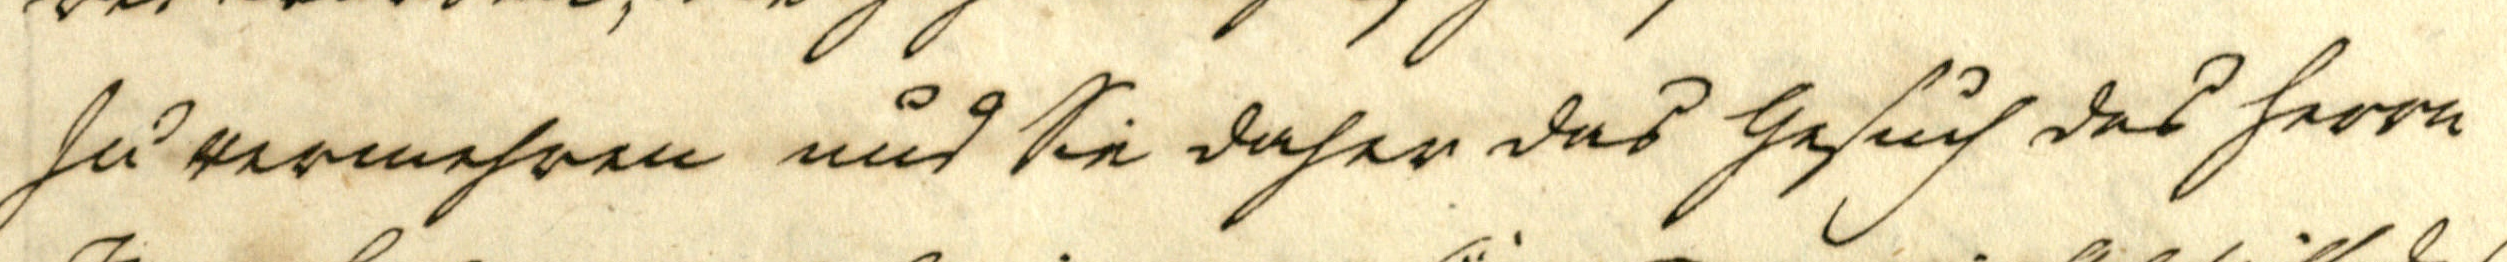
zu vermehren und Sie daher das Gesuch des Herrn
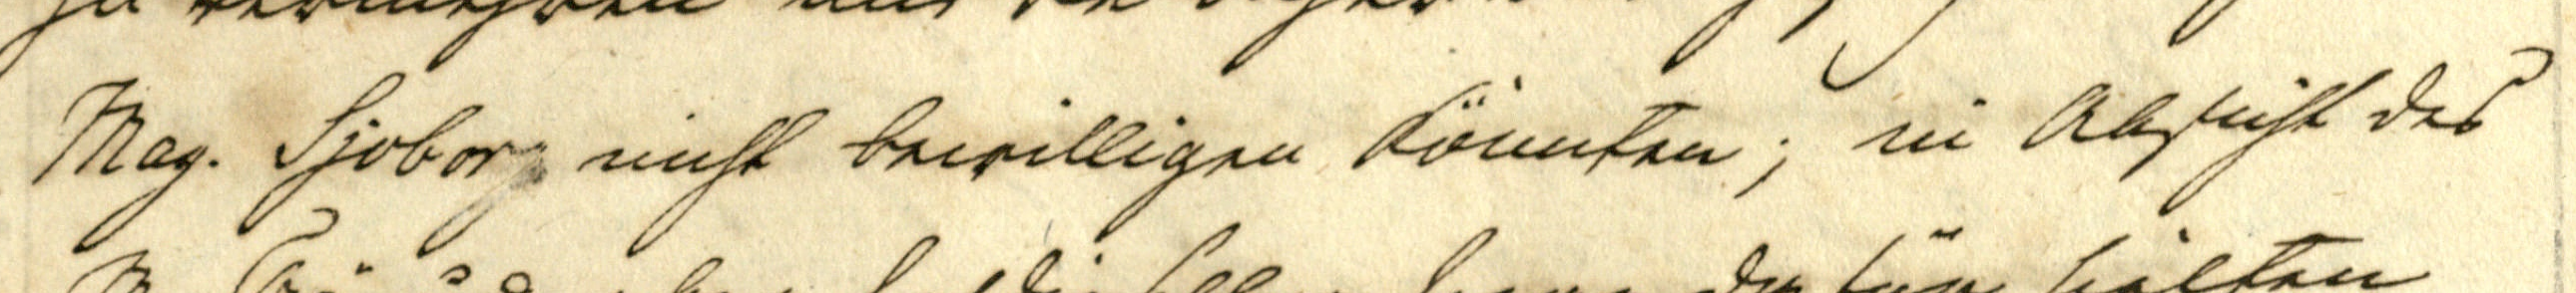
Mag. Sjoborg nicht bewilligen könnten; in Absicht des
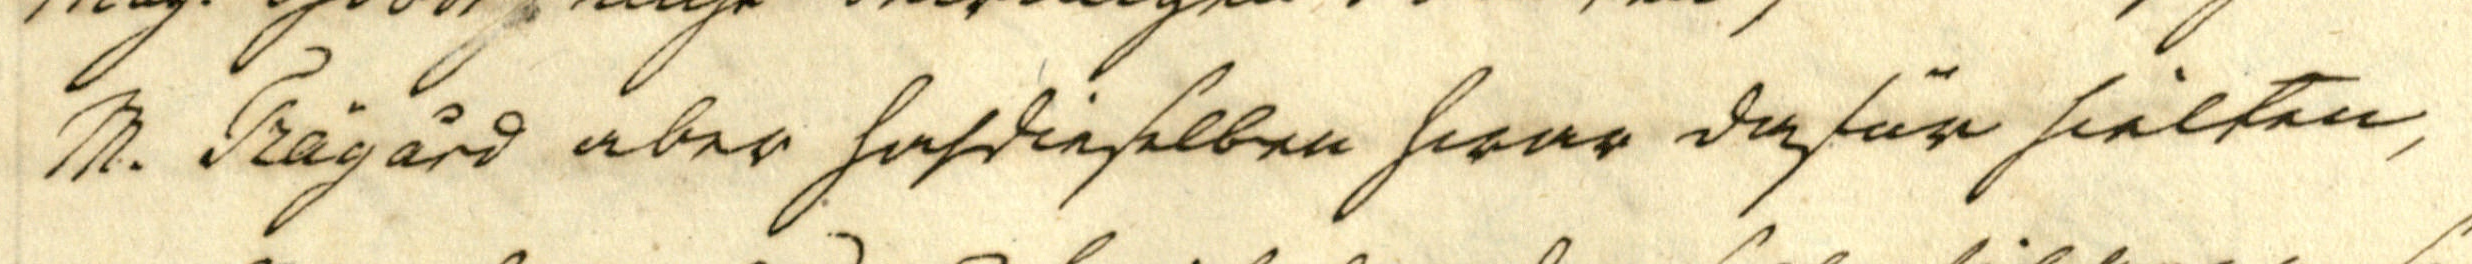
M. Trägård aber hochdieselben zwar dafür hielten,
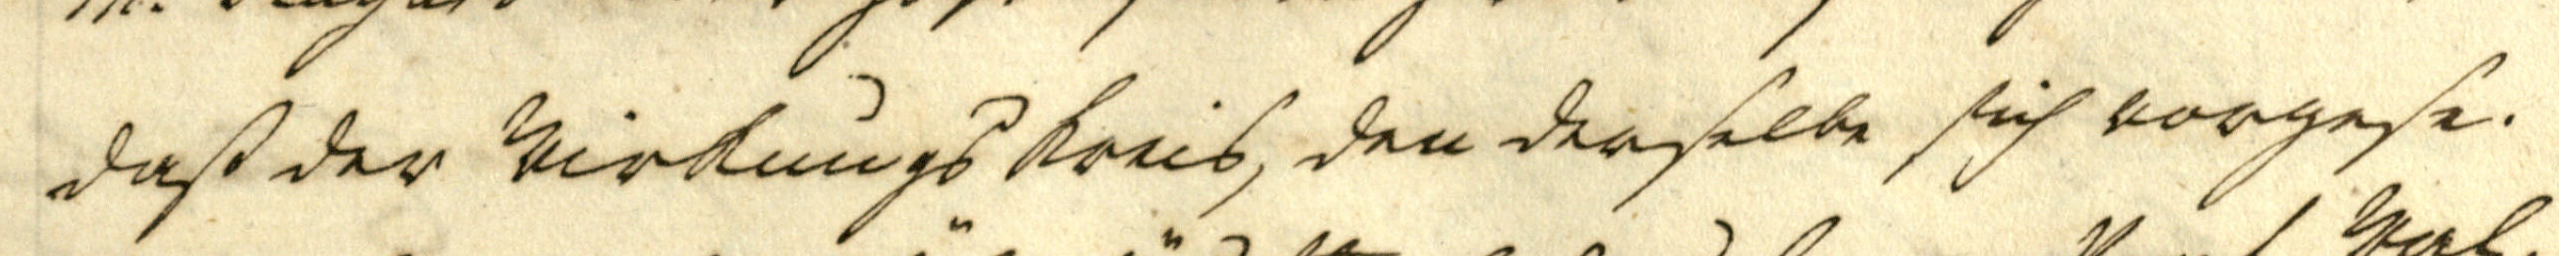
daß der Wirkungs kreis, den derselbe sich vorgese¬
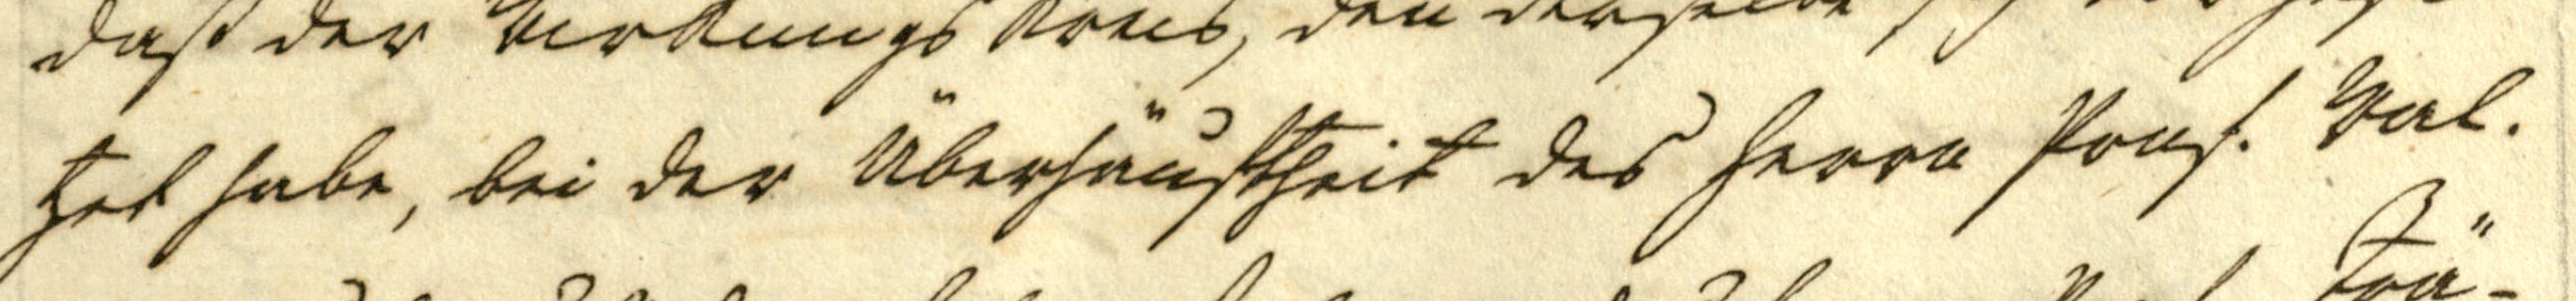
tzet habe, bei der Überhäuftheit des Herrn Prof. Wal¬
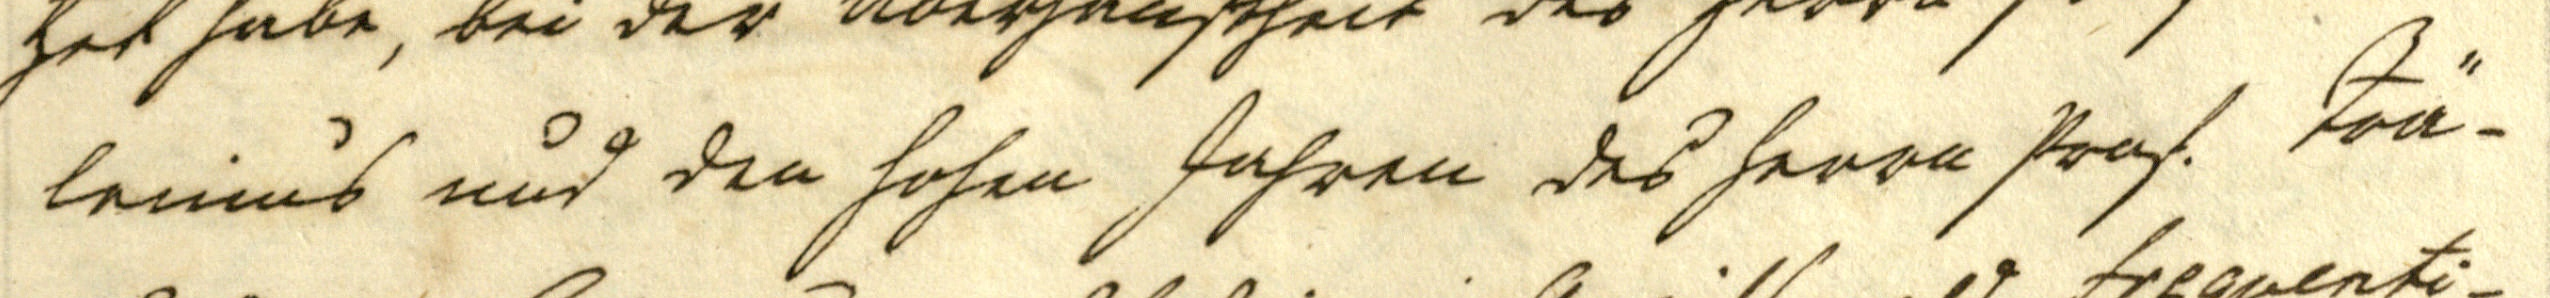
lenius und den hohen Jahren des Herrn Prof. Trä¬
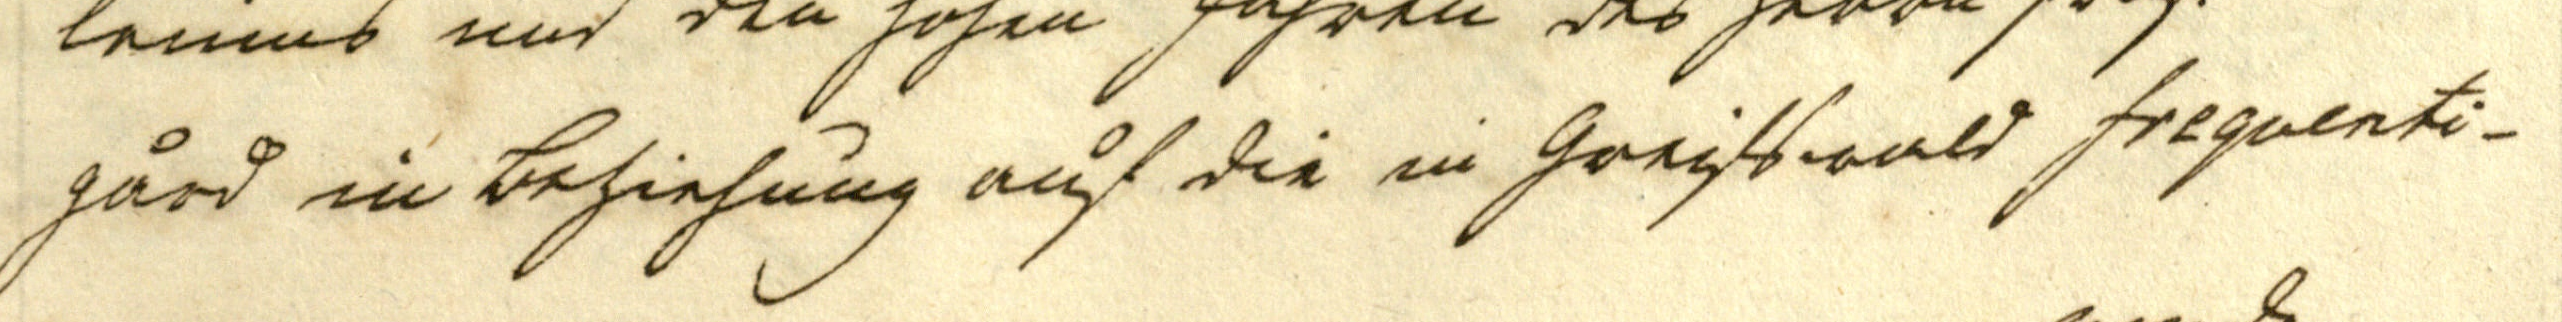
gård in Beziehung auf die in Greifswald frequenti-
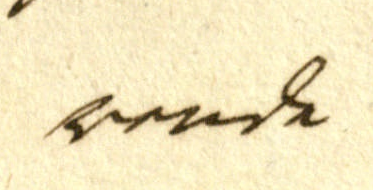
rende
